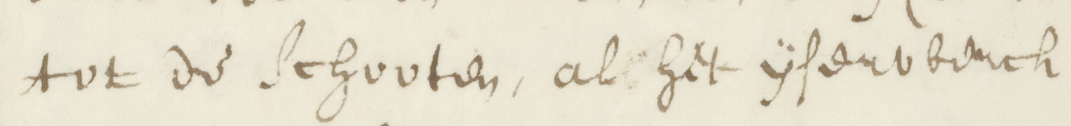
tot de schooten, al het ijserwerck
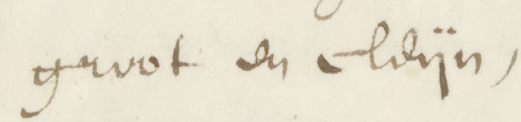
groot en cleijn.
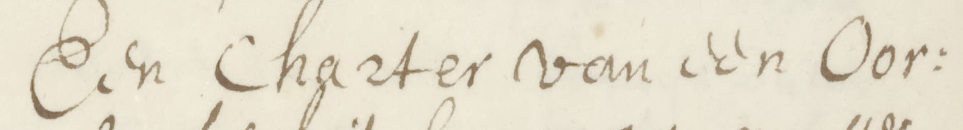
Een Charter van een Oor:
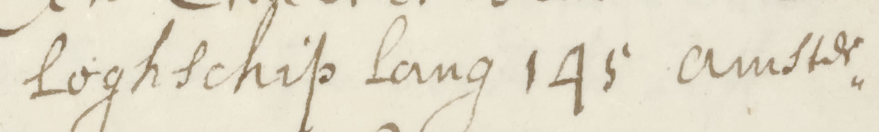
loghschip lang 145 Amster„
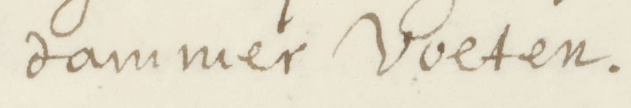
dammer Voeten.
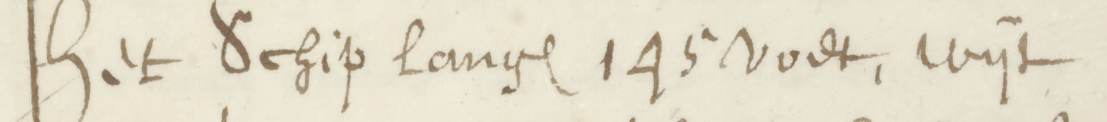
Het schip langh 145 voet, wijt
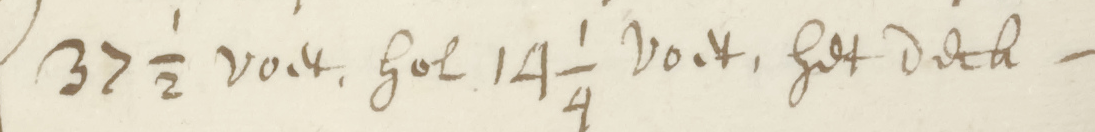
37½ voet, hol 14¼ voet, het deck
